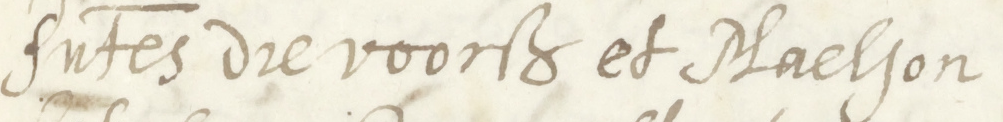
pntes die voors et Maelson
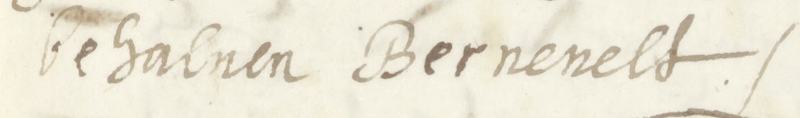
behaluen Berneuelt.
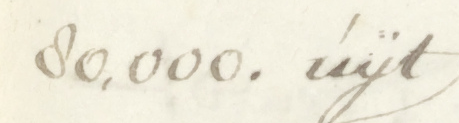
80.000. uijt
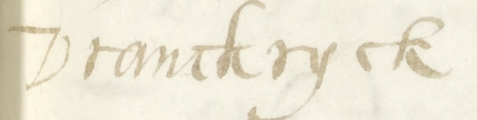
Vranckrijck
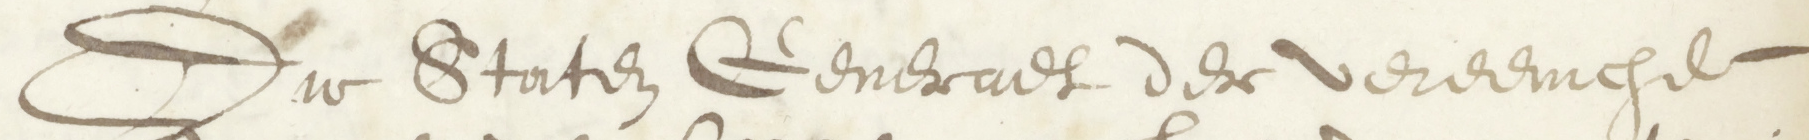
Die Staten Generael der vereenichde
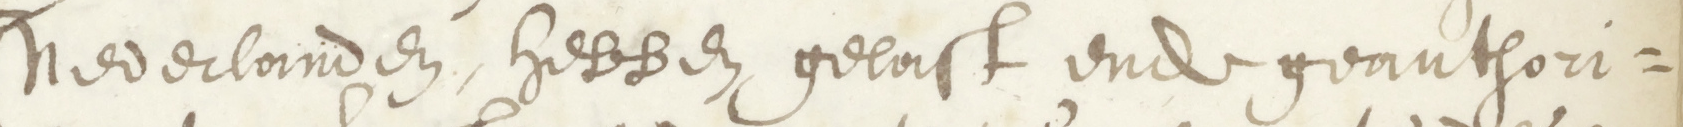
Nederlanden, hebben gelast ende geauthori=
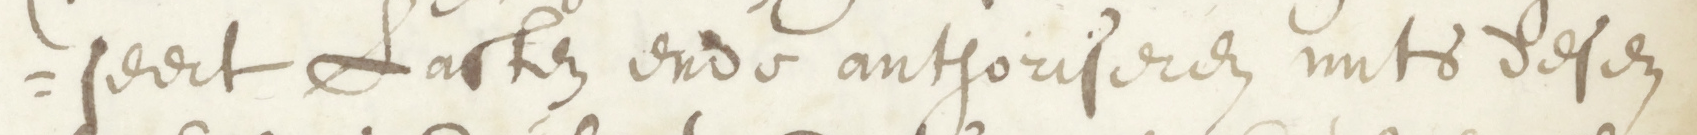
=seert Lasten ende authoriseren mits desen
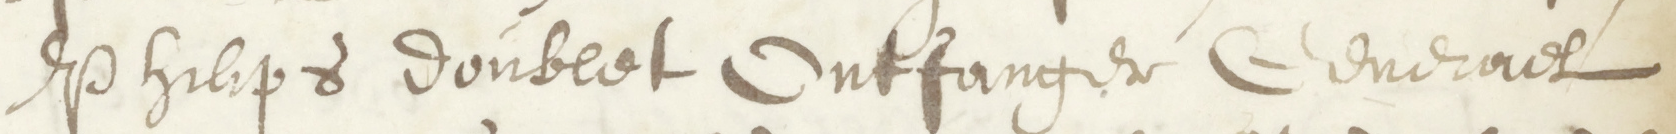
Philips Doublet Ontfanger Generael
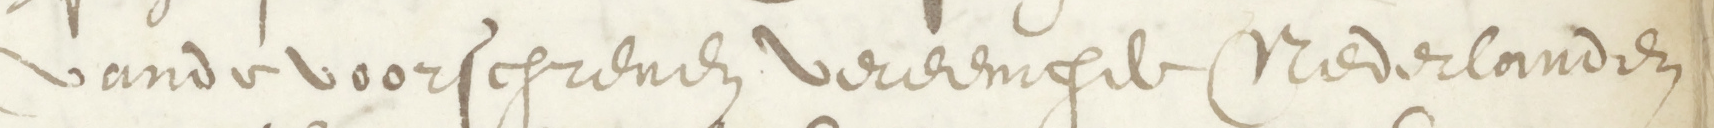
vande voorschreuen vereenichde Nederlanden
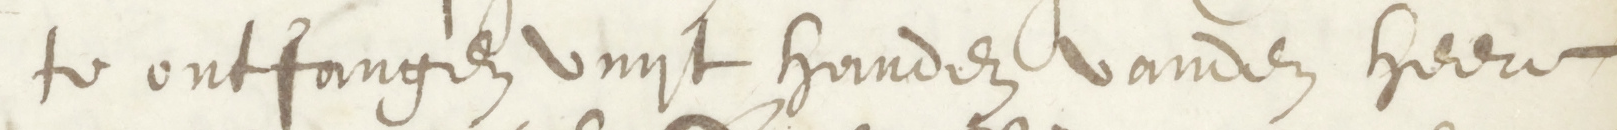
te ontfangen vuyt handen vanden heere
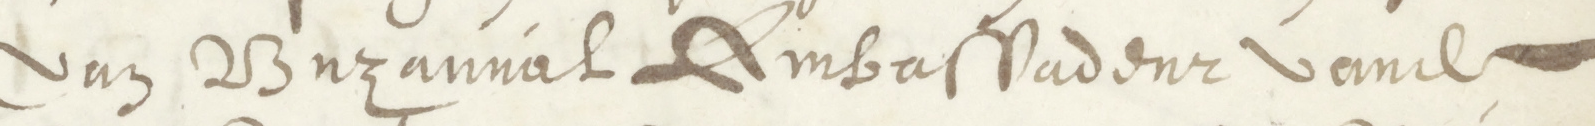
van Buzanual Ambassadeur vande
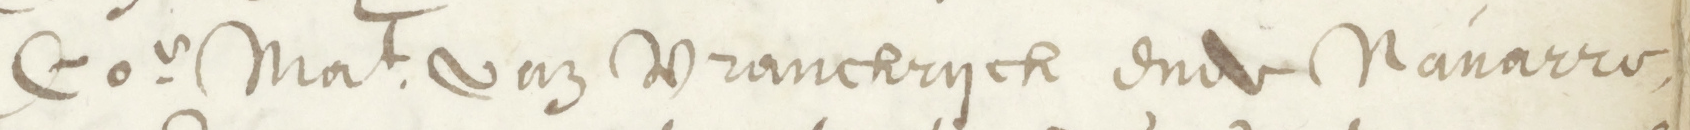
Coe. Mat. van Vranckryck ende Nauarre
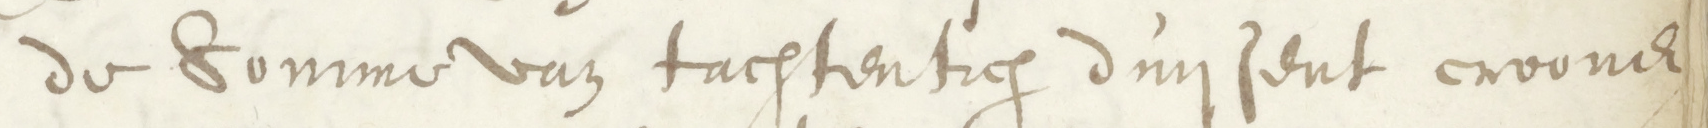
de somme van tachtentich duysent croonen
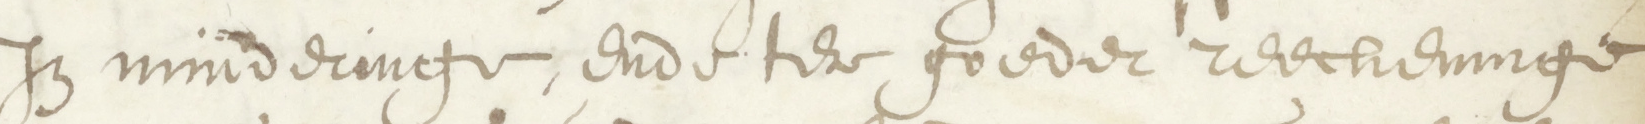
In minderinge, ende ter goeder reeckeninge
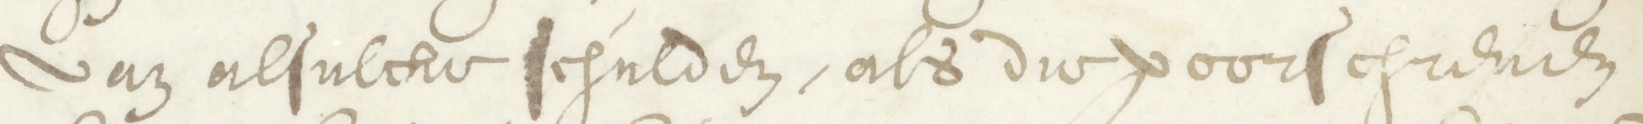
van alsulcke schulden, als die voorschreuen
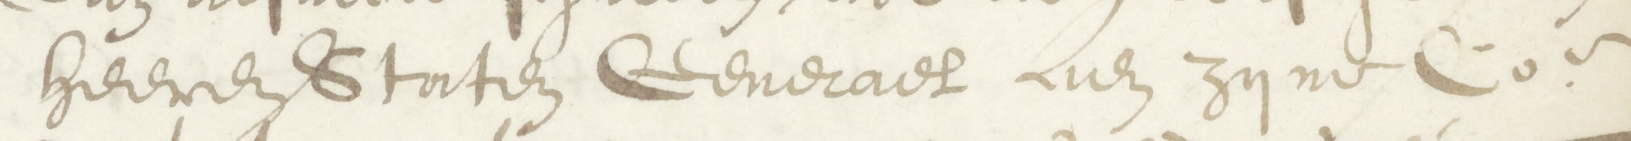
heeren Staten Generael aen zijne Coe
